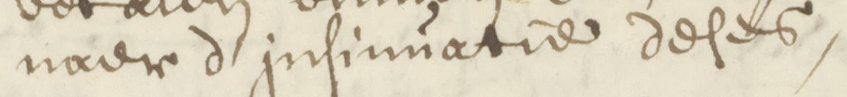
naer d‛insinuatie deses.
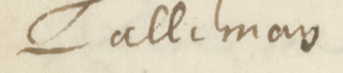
Lalleman
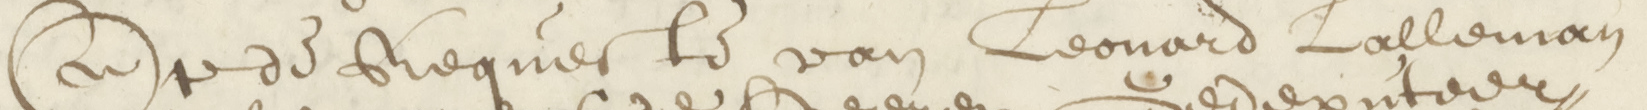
Opde Requeste van Leonard Lalleman
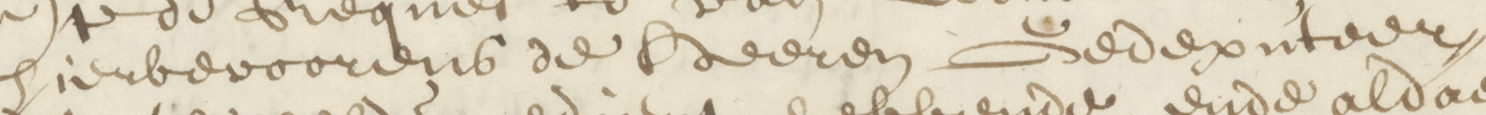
hierbevoorens de Heeren Gedeputeer„
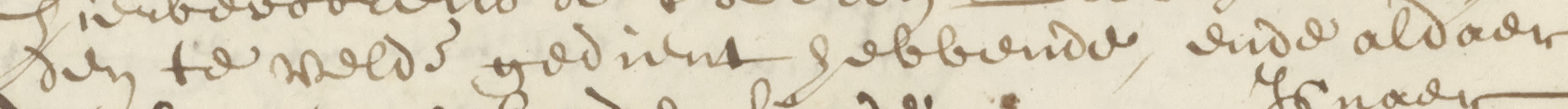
den te Velde gedient hebbende, ende aldaer
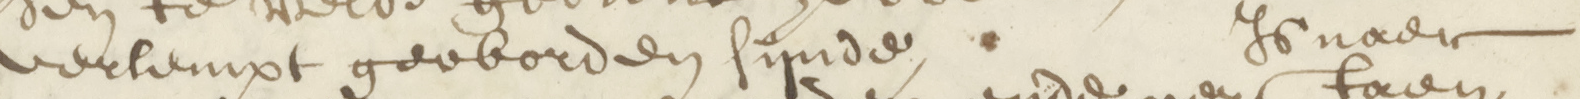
verlempt geworden sijnde, Is naer
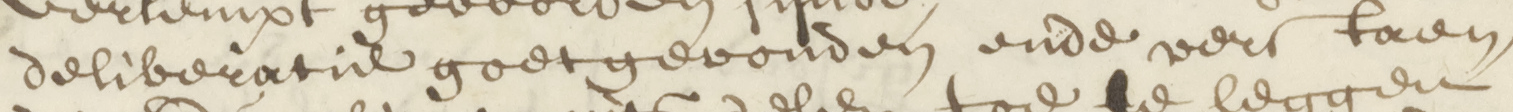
deliberatie goetgevonden ende verstaen,
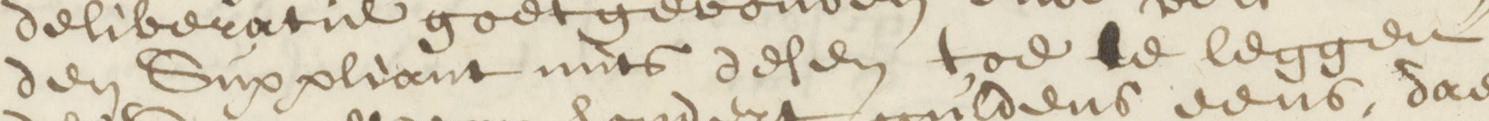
den Suppliant mits desen toe te leggen
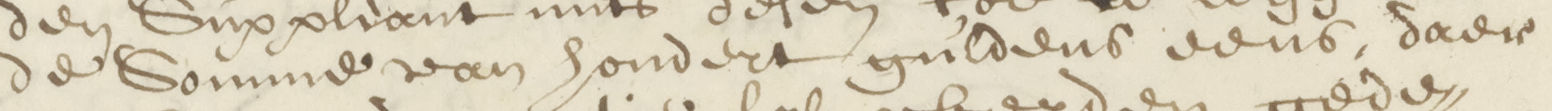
de Somme van hondert guldens eens, daer
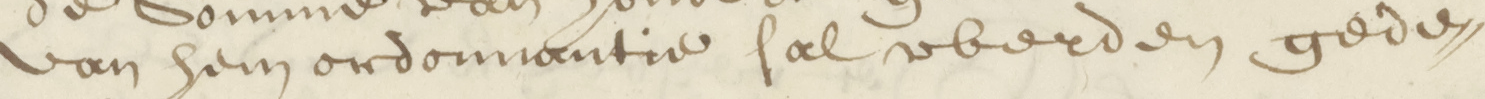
van hem ordonnantie sal werden gede„
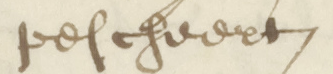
pescheert.
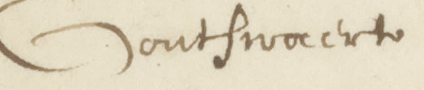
Goutswaert
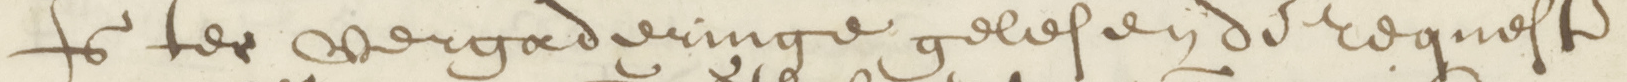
Is ter Vergaderinge gelesen de requeste
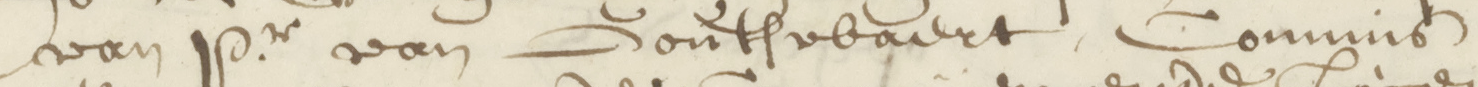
van Pr. van Goutswaert, Commis
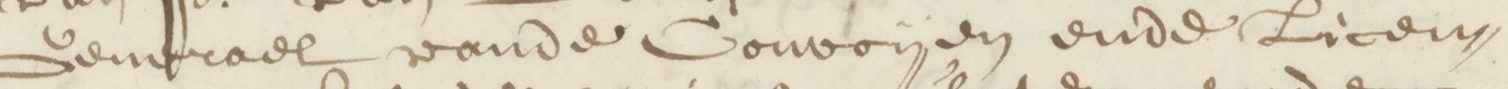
Generael vande Convoijen ende Licen„
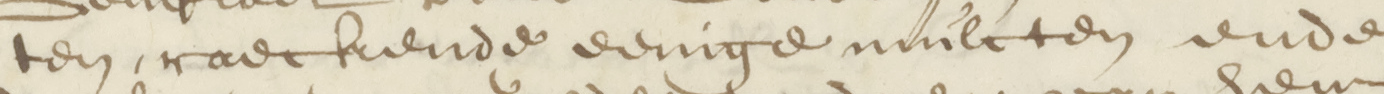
ten, raeckende eenige mulcten ende
